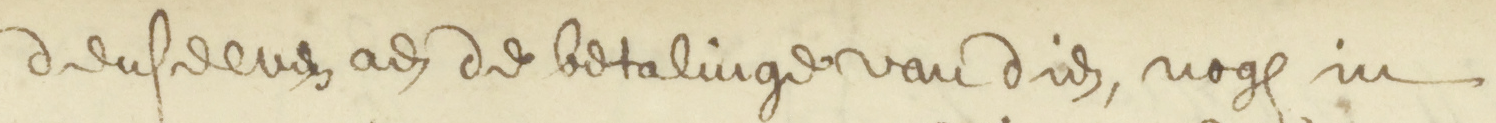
denselven aen de betalinge van dien, nogh in
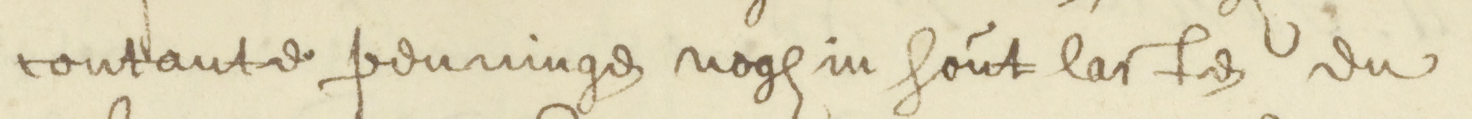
contante penningen nogh in hout lasten en
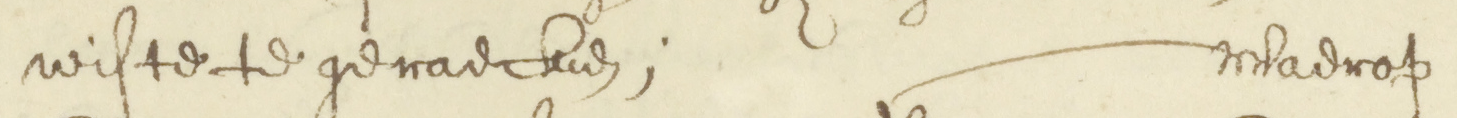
wiste te geraecken: Waerop
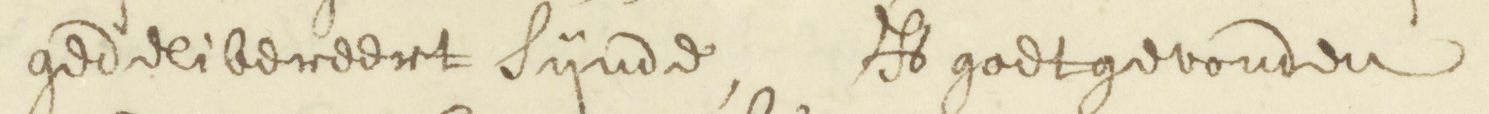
gedelibereert sijnde, is goetgevonden
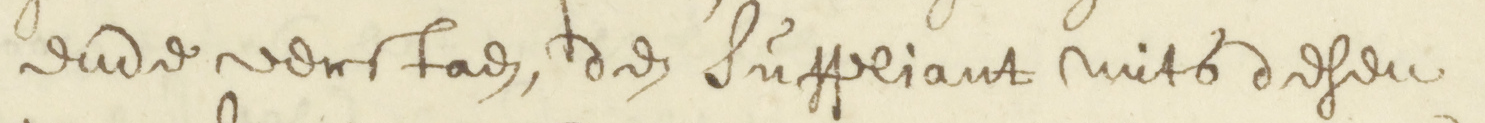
ende verstaen, den Suppliant mits desen
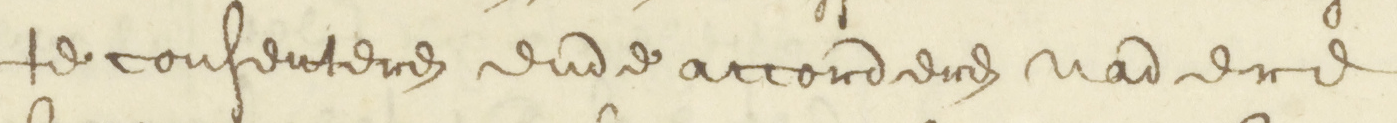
te consenteren ende accorderen nadere
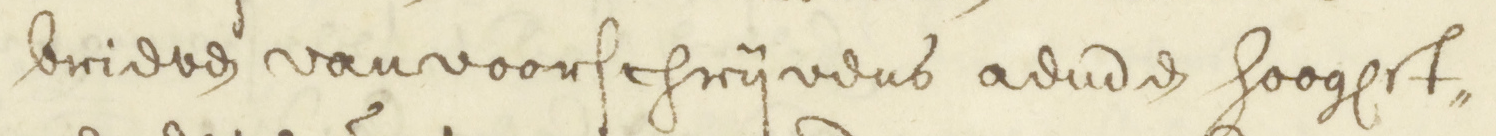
brieven van voorschrijvens aende hooghst
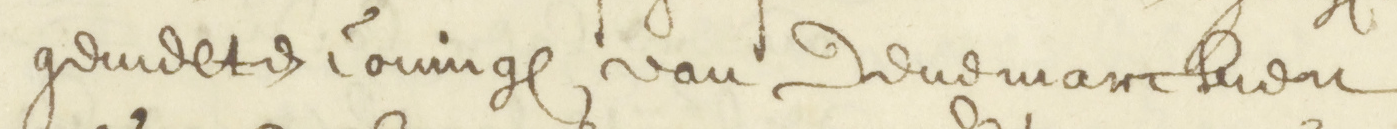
gemelte Coningh van Denemarcken
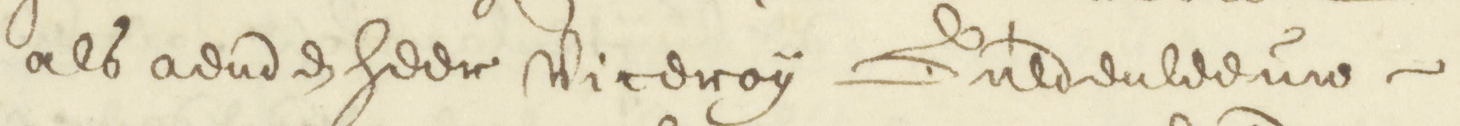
als aende heer Viceroij Guldenleeuw
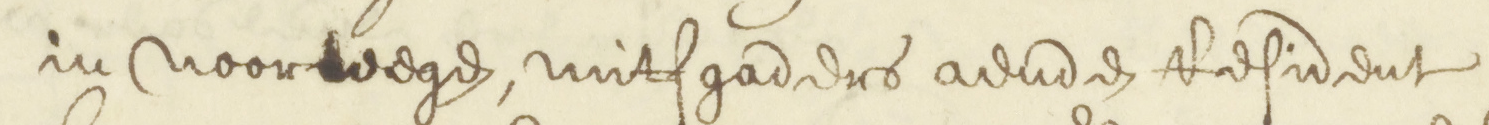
in Noorwegen, mitsgaders aenden Resident
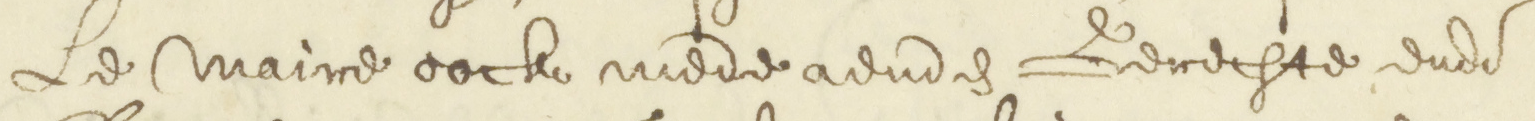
Le Maire oock mede aenden Gerechte ende
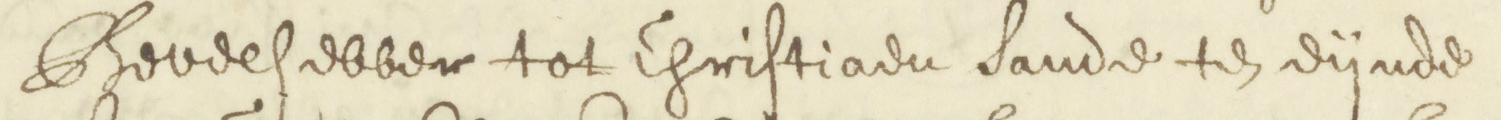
Bevelhebber tot Christiaen Sande ten eijnde
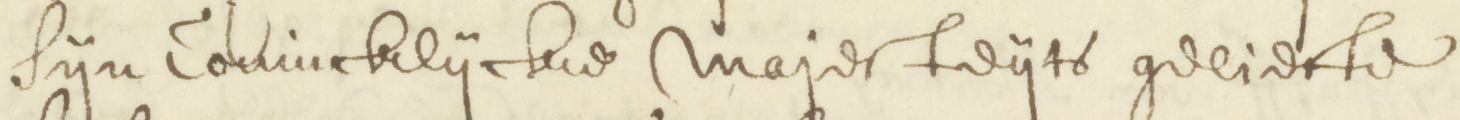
sinj Conincklijcke Majesteijts geliefte
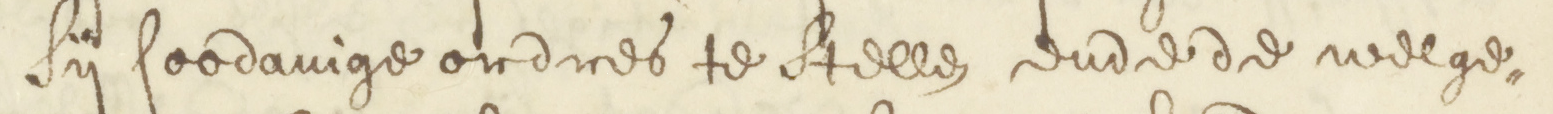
sij soodanige ordres te stellen ende de welge„
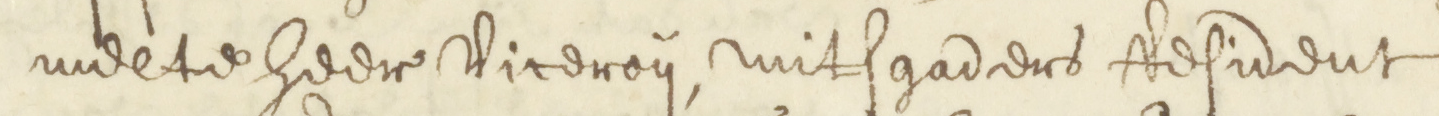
melte heer Viceroij, mitsgaders Resident
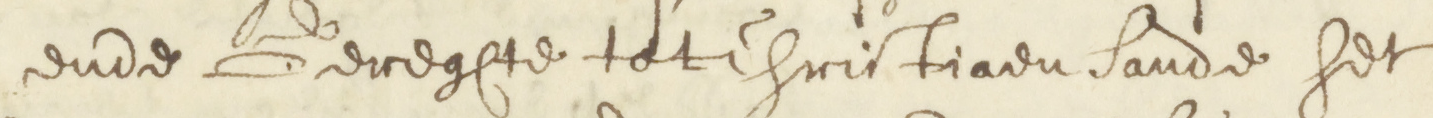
ende Gereghte tot Christiaen Sande het
